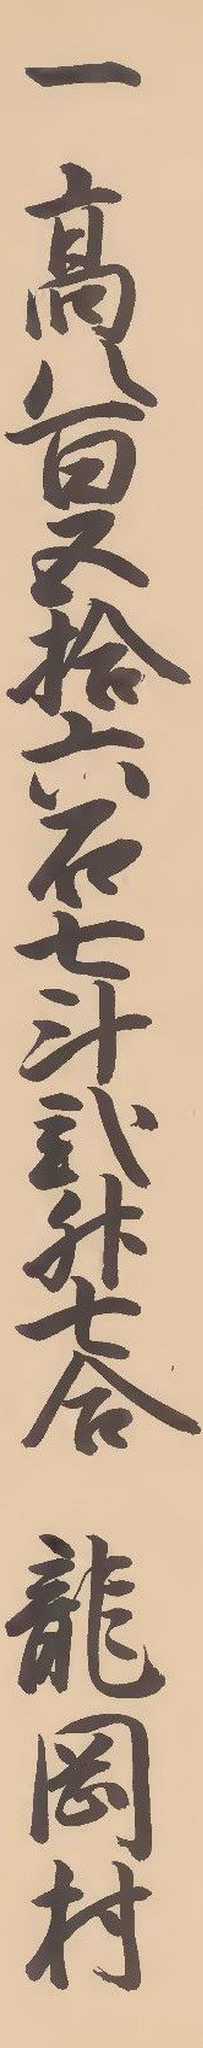一高八百五拾六石七斗弐升七合竜岡村
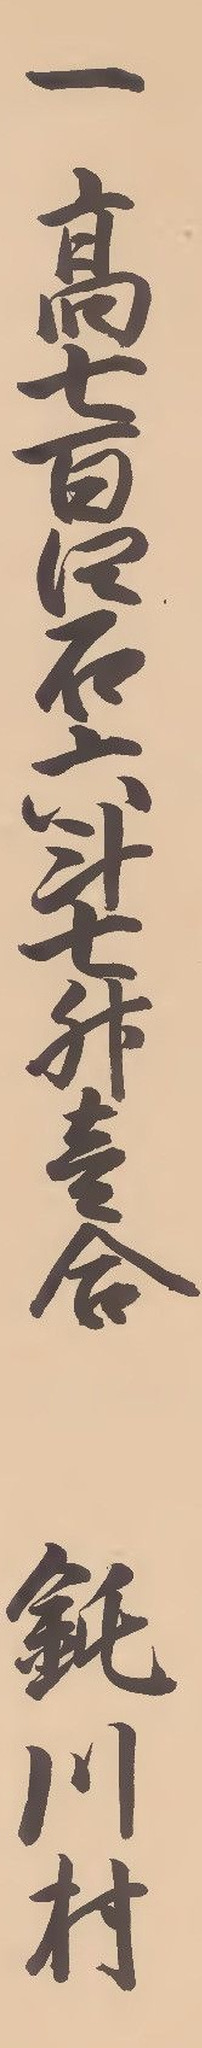一高七百四石六斗七升壱合鈍川村
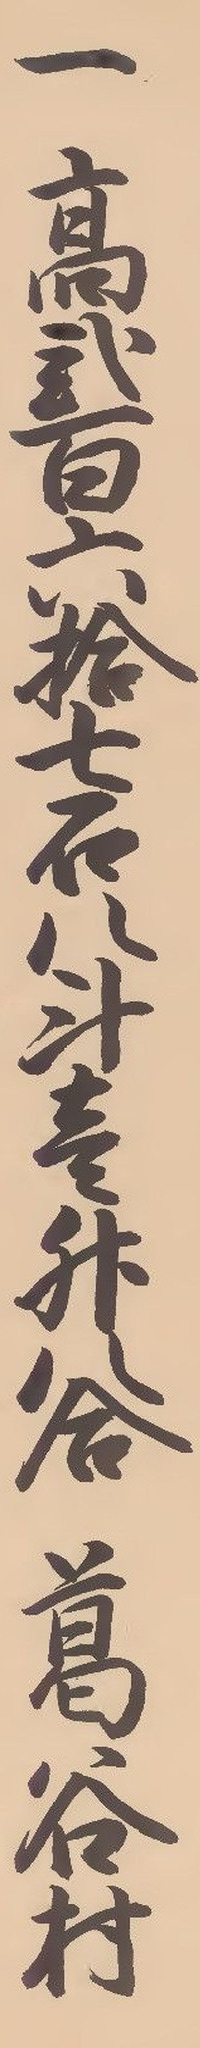一高弐百六拾七石八斗壱升八合葛谷村

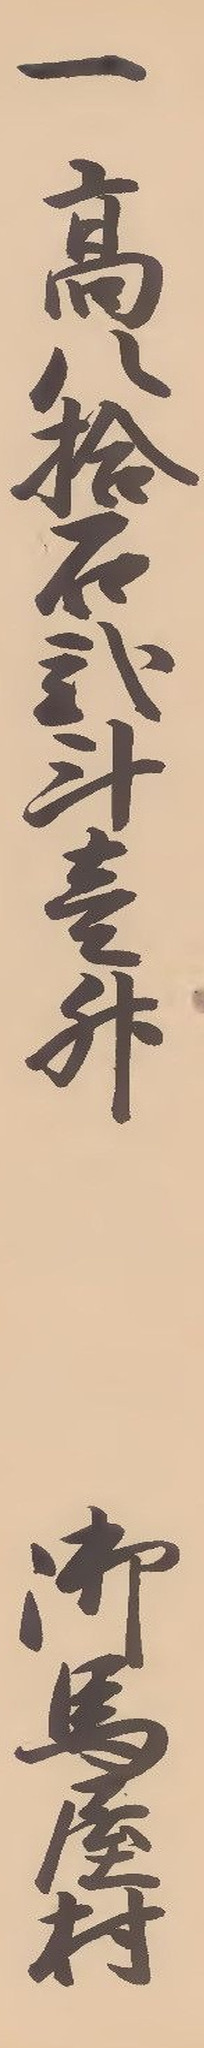一高八拾石弐斗壱升御馬屋村
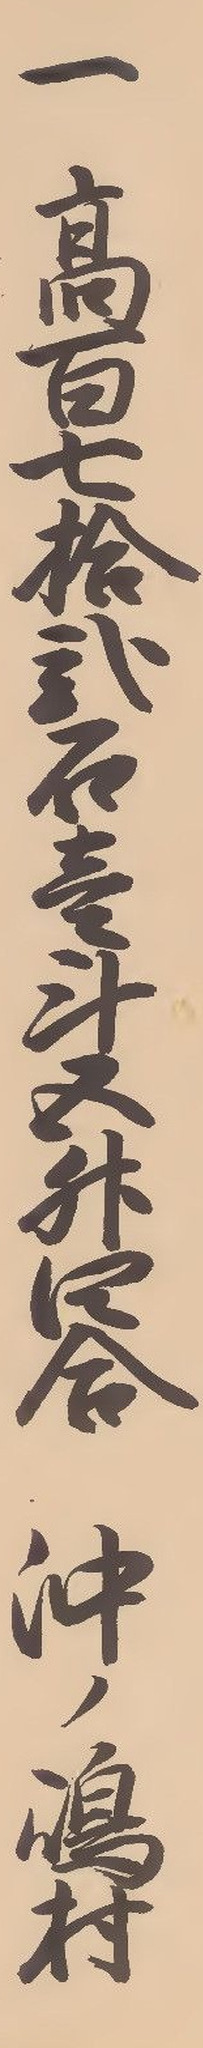一高百七拾弐石壱斗五升四合沖ノ島村
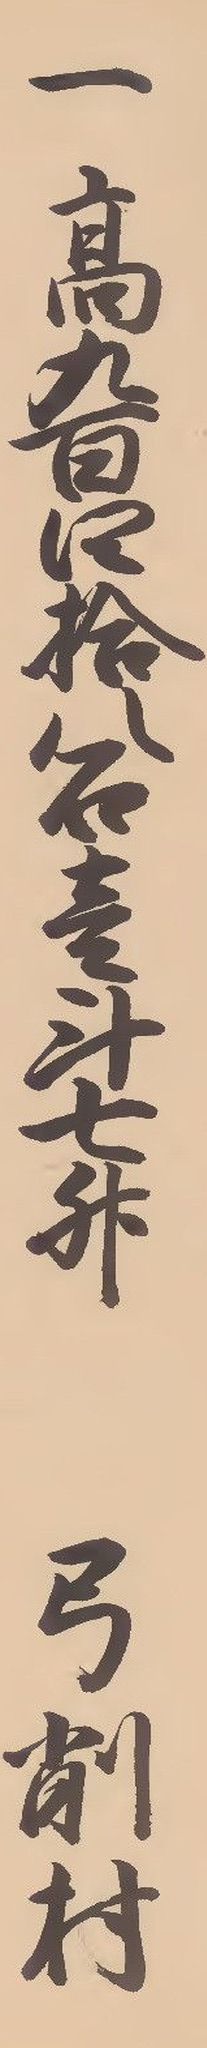一高九百四拾八石壱斗七升弓削村
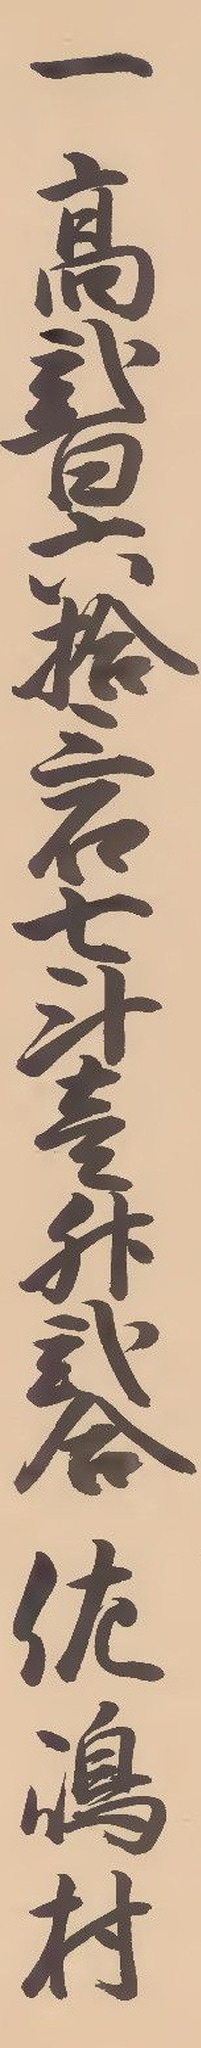一高弐百六拾三石七斗壱升弐合佐島村
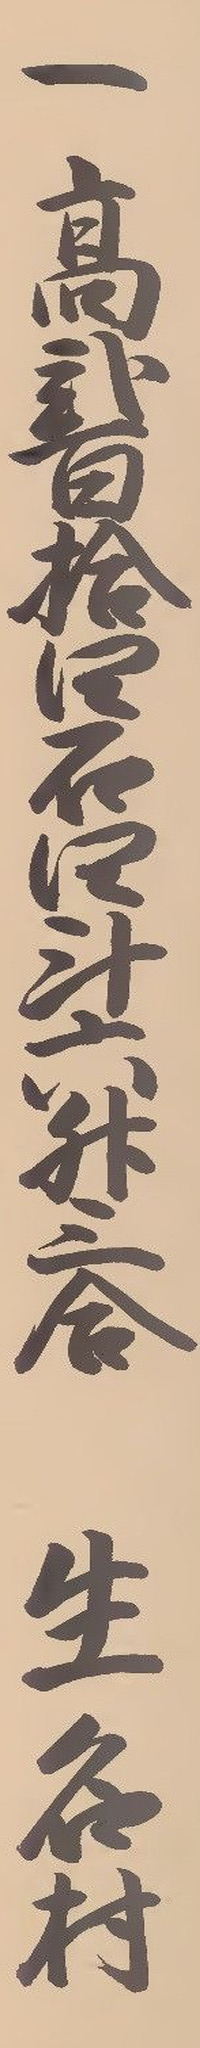一高弐百拾四石四斗六升三合生名村
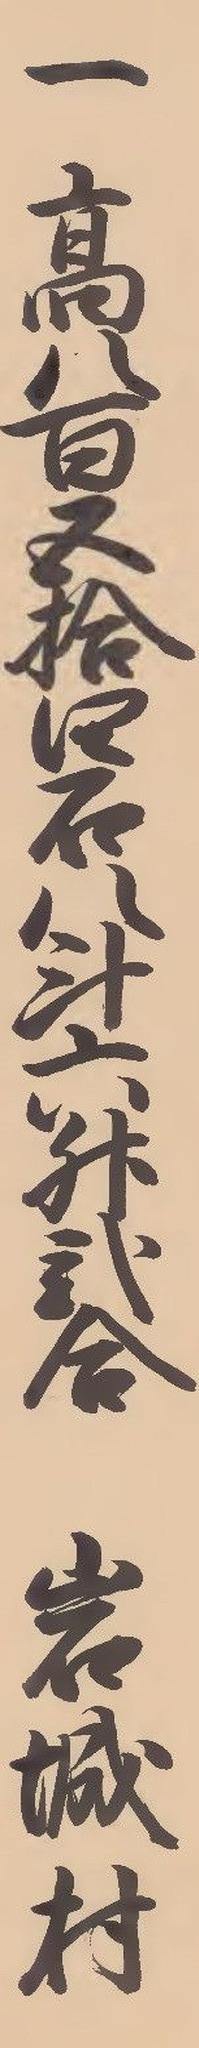一高八百五拾四石八斗六升弐合岩城村
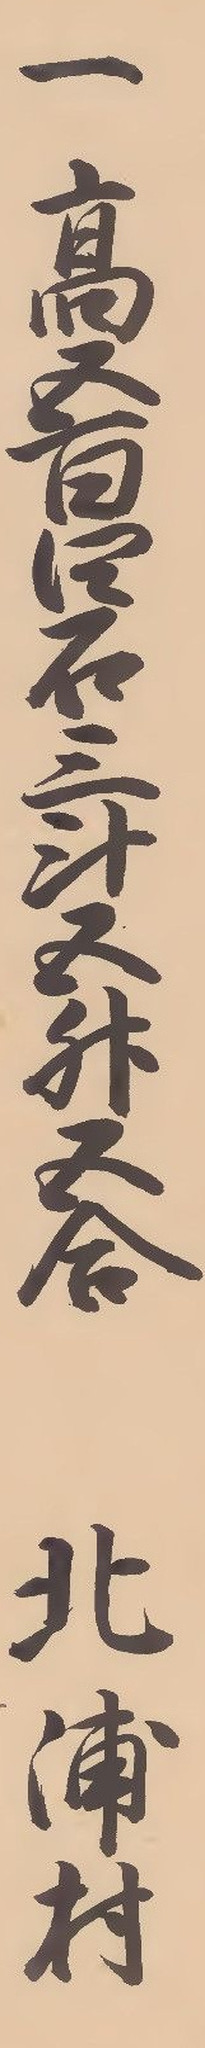一高五百四石三斗五升五合北浦村
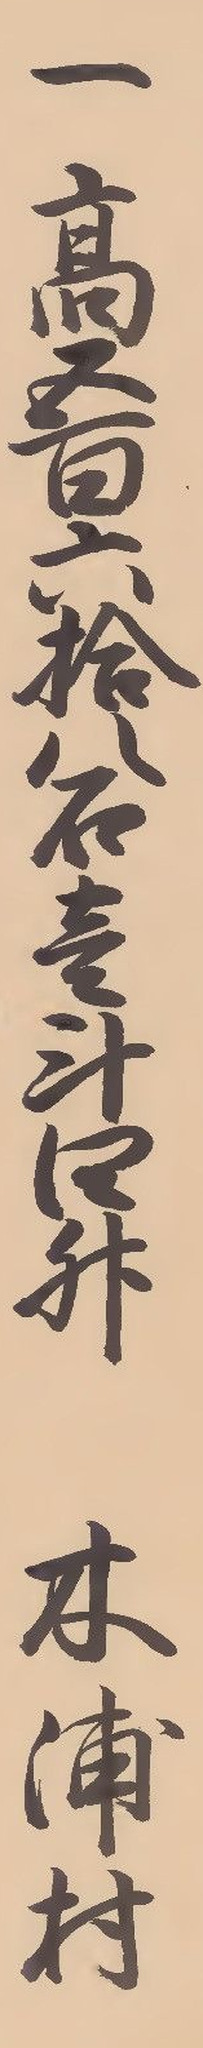一高五百六拾八石壱斗四升木浦村

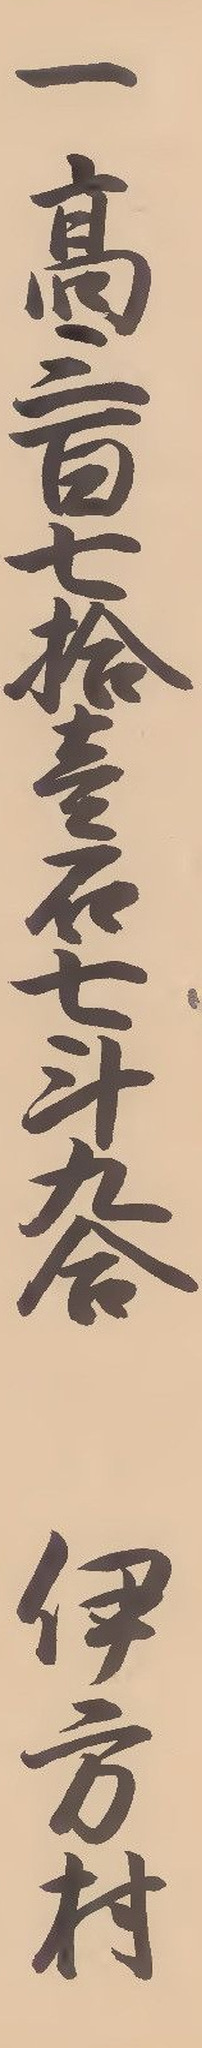一高三百七拾壱石七斗九合伊方村
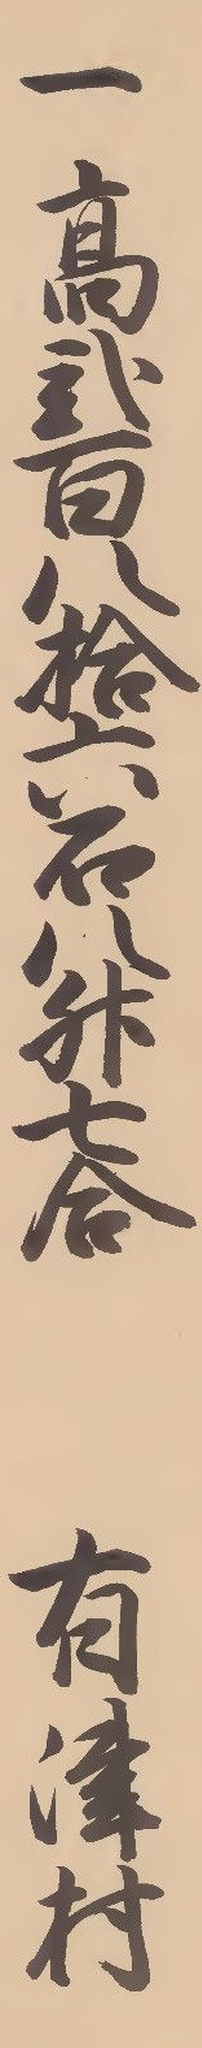一高弐百八拾六石八升七合有津村
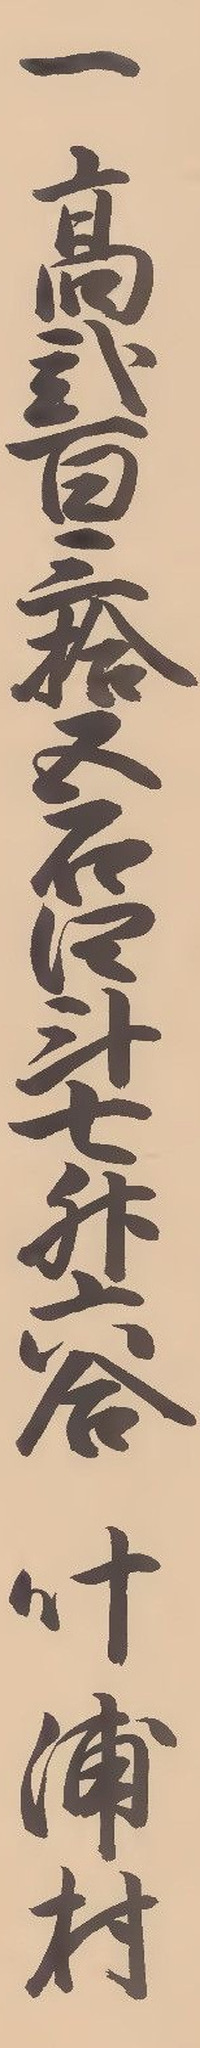一高弐百三拾五石四斗七升六合叶浦村
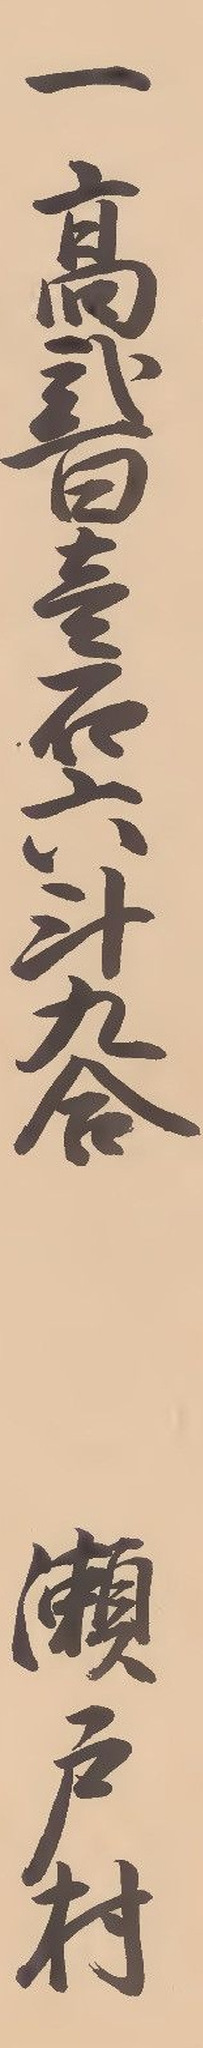一高弐百壱石六斗九合瀬戸村
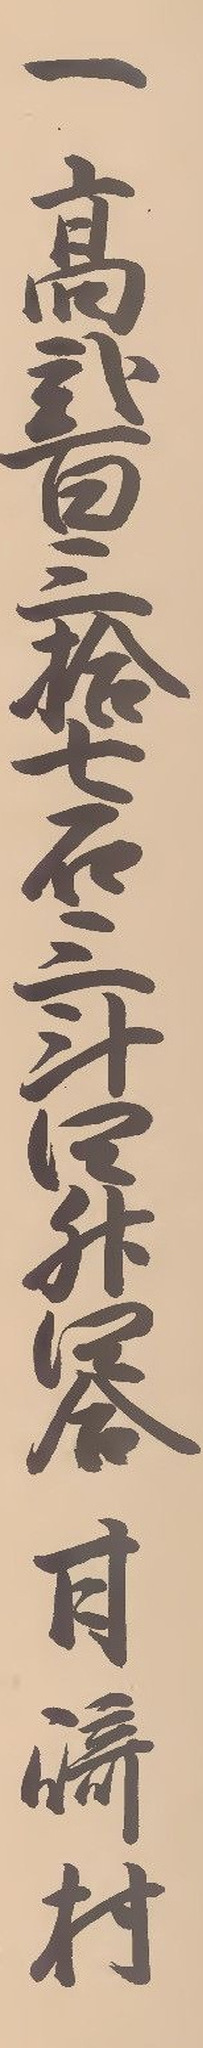一高弐百三拾七石三斗四升四合甘崎村
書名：伊予国郷帳
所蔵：国立公文書館 National Archives of Japan
